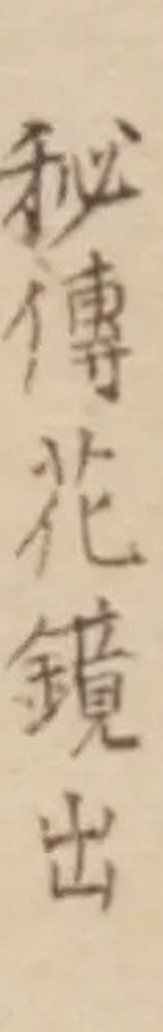秘傳花鏡出
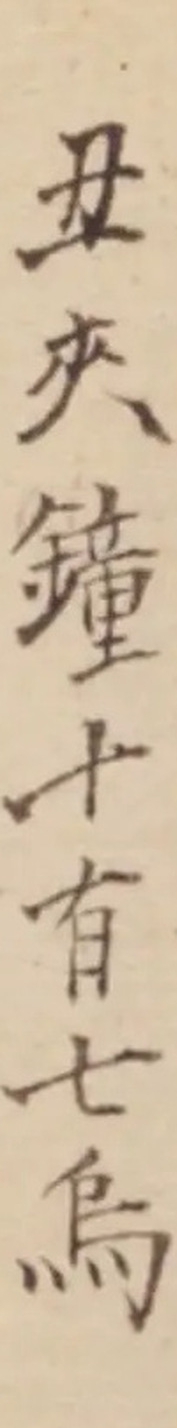丑夾鐘十有七日烏
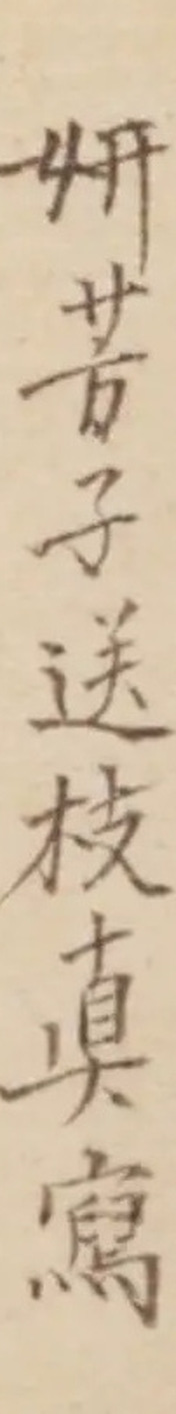妍芳子送枝真寫
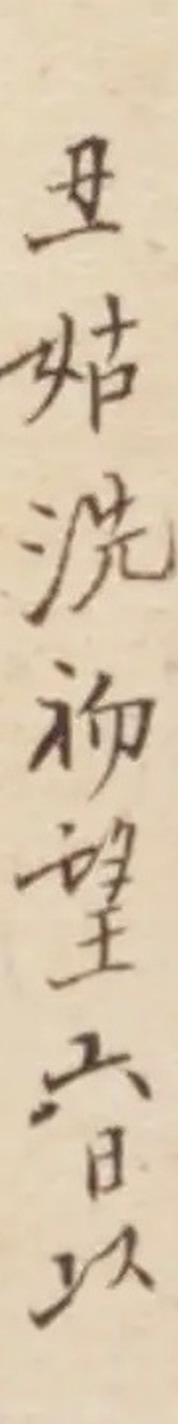丑姑洗初望六日以
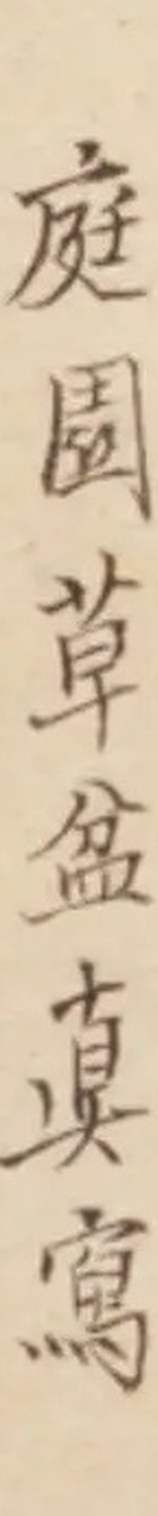庭園草盆真寫
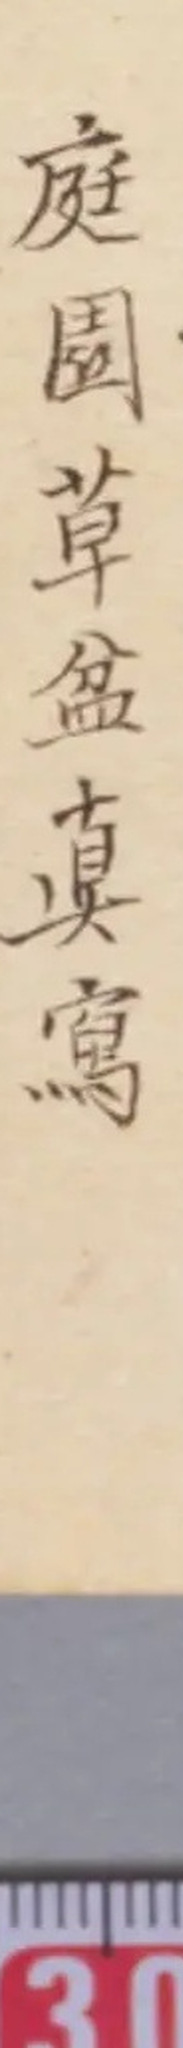庭園草盆真寫
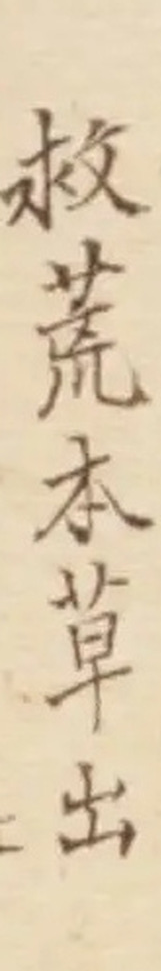救荒本草出
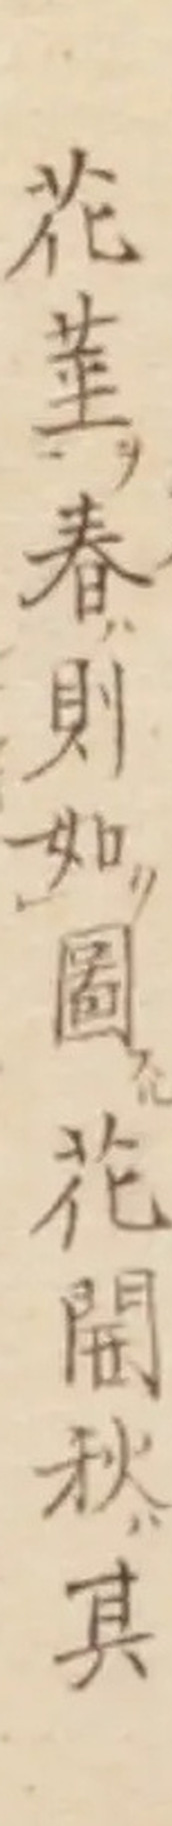花莖ヲ春ハ則如ク圖ナル花開秋ハ其

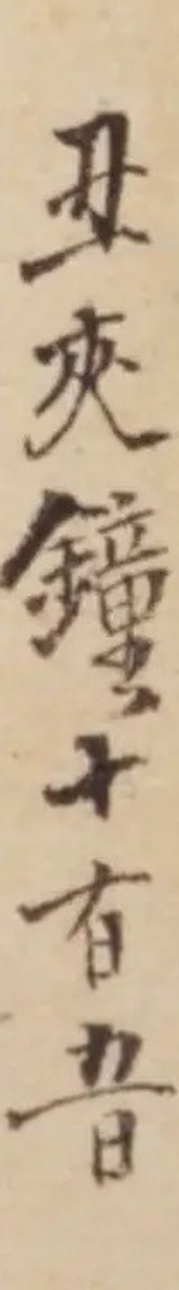丑夾鐘十有五日
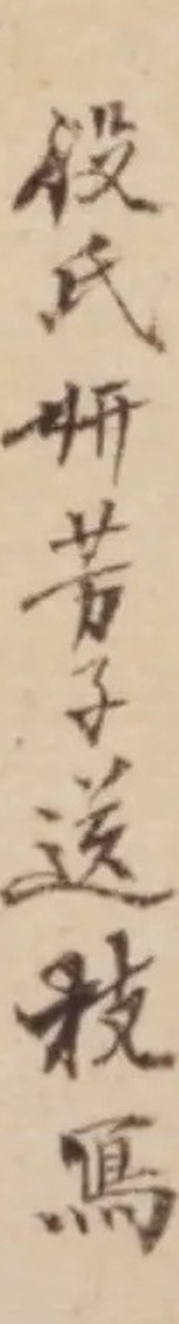氏妍芳子送枝寫
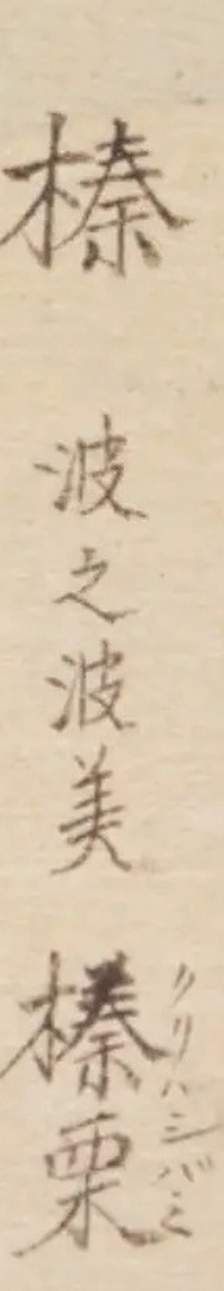榛波之波美榛栗
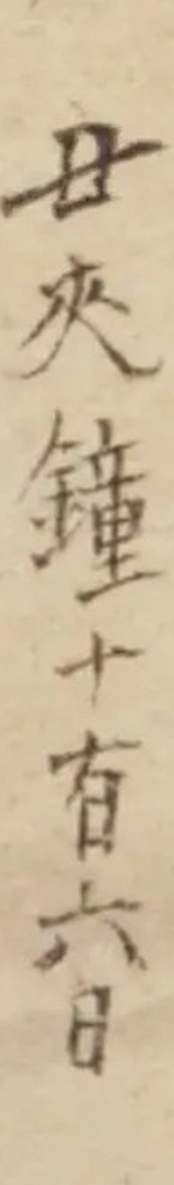丑夾鐘十有六日

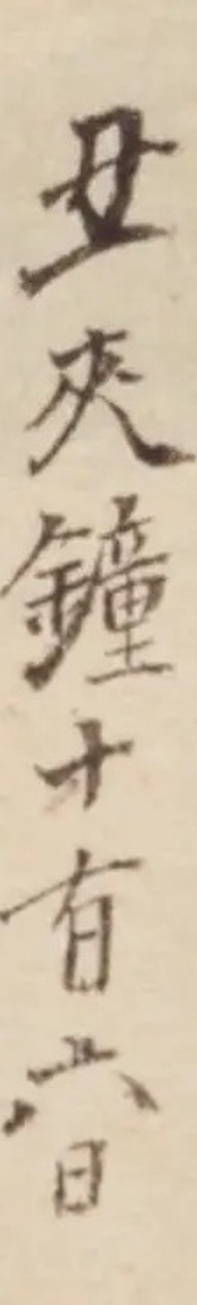丑夾鐘十有六日

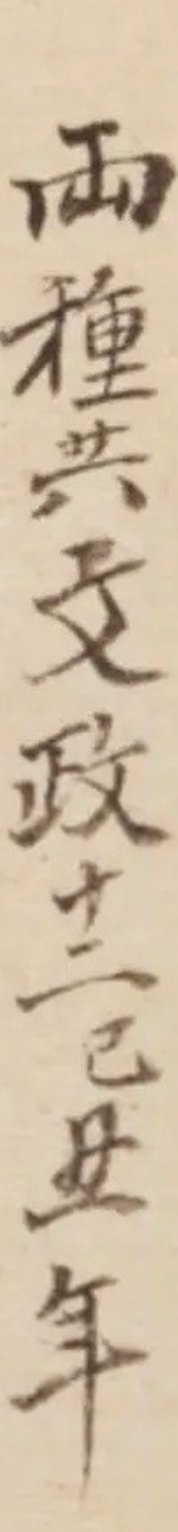両種共文政十二乙己丑年
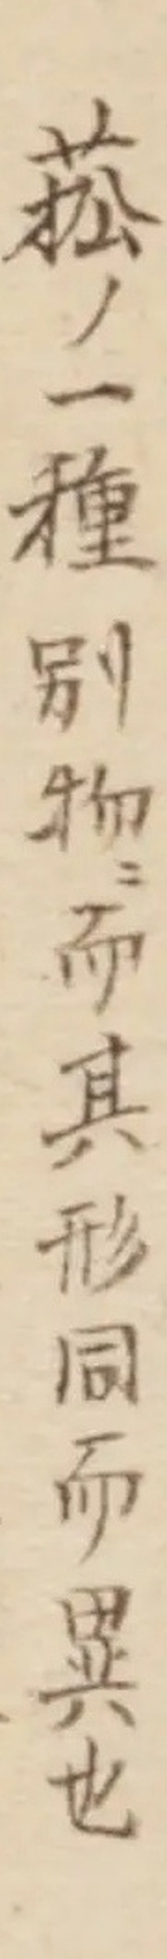紫葉菜菘の一種別物に而其形同而異也
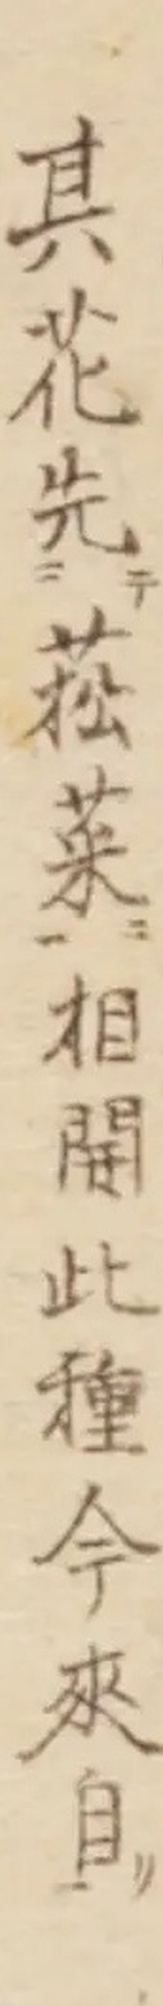其花先て菘菜に相開此種今來自り
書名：梅園草木花譜春之部. 4
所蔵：国立国会図書館 National Diet Library, JAPAN
